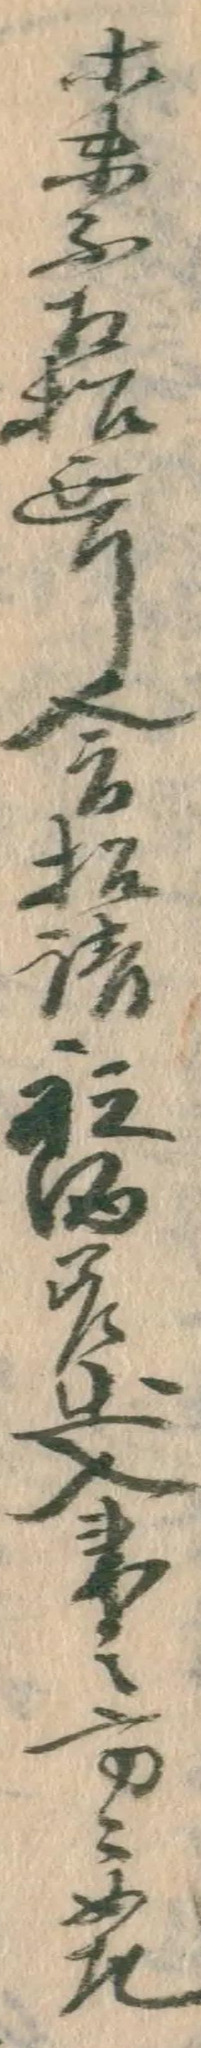等未不相招延引今日招請祝酒差出入来之方々如左
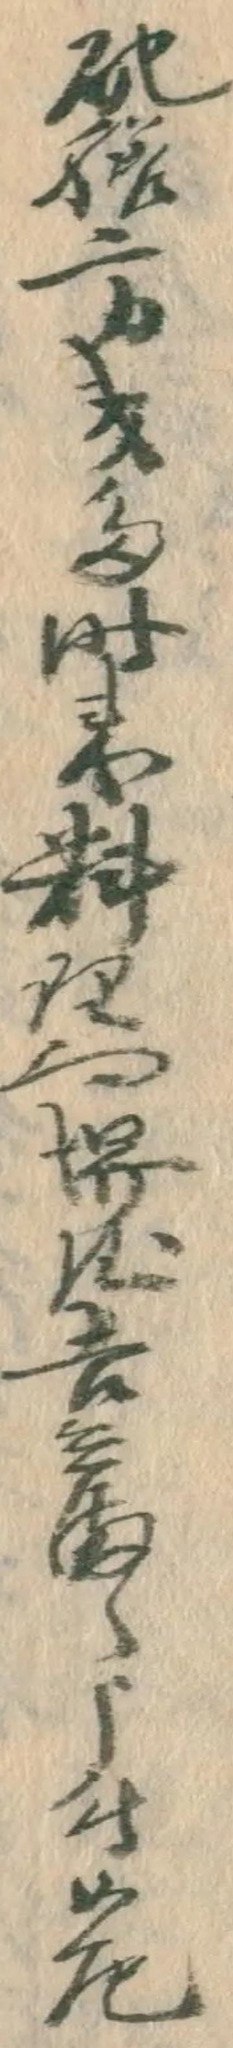配膳方幾多時来料理向堺屋吉兵衛へ申付如左

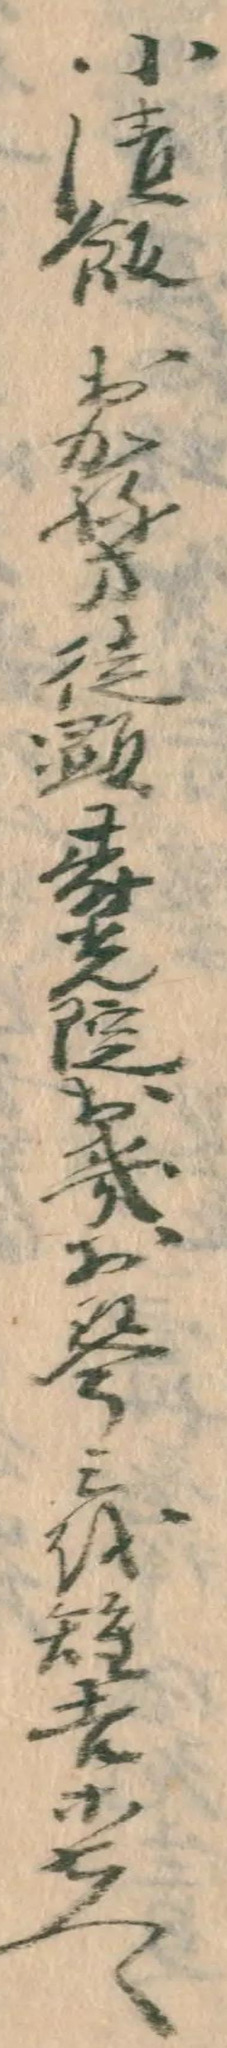小漬飯おかね方徒顕壽光院おきお琴三越雄吉等七人へ
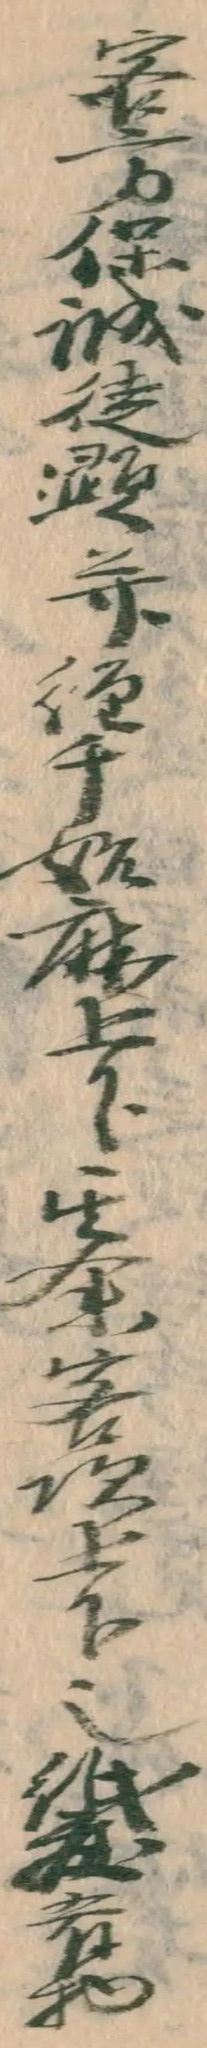客方保誠徒顕并経千始麻上下其余客次上下也紙敷肴物
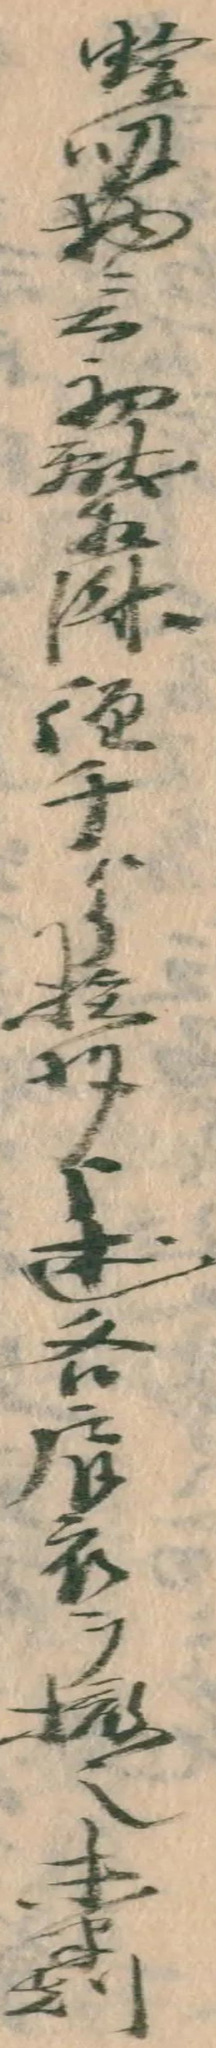蛤吸物ニ而初献相済経千より挨拶申述各肩衣ヲ撤也未半刻
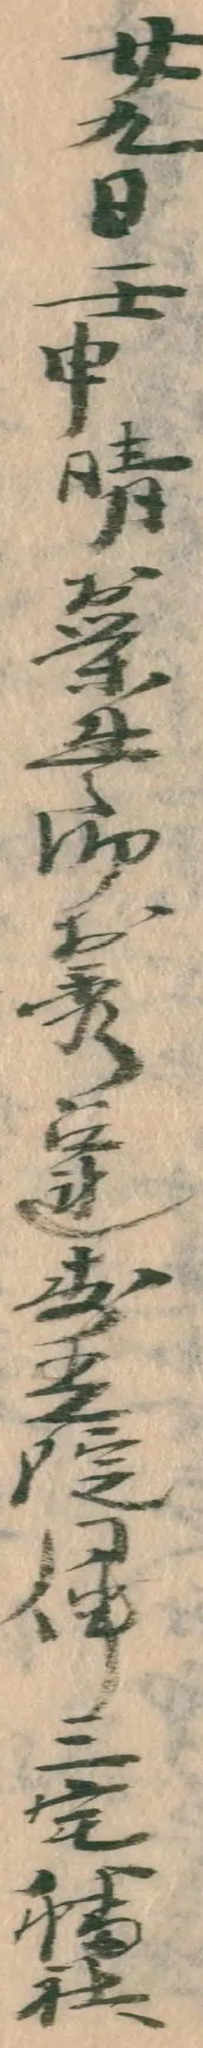廿九日壬申晴お栄丑之助お秀召連壽光院同伴三宅八幡社へ
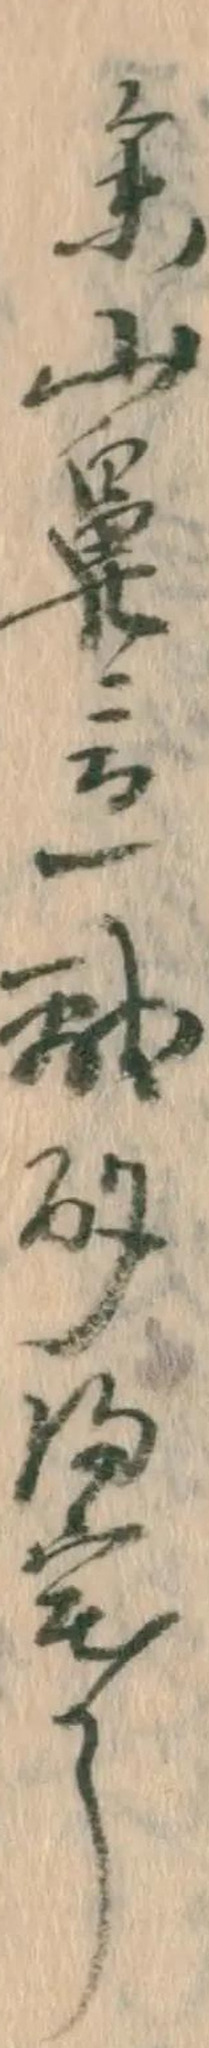参山鼻ニ而一献酌帰宅了
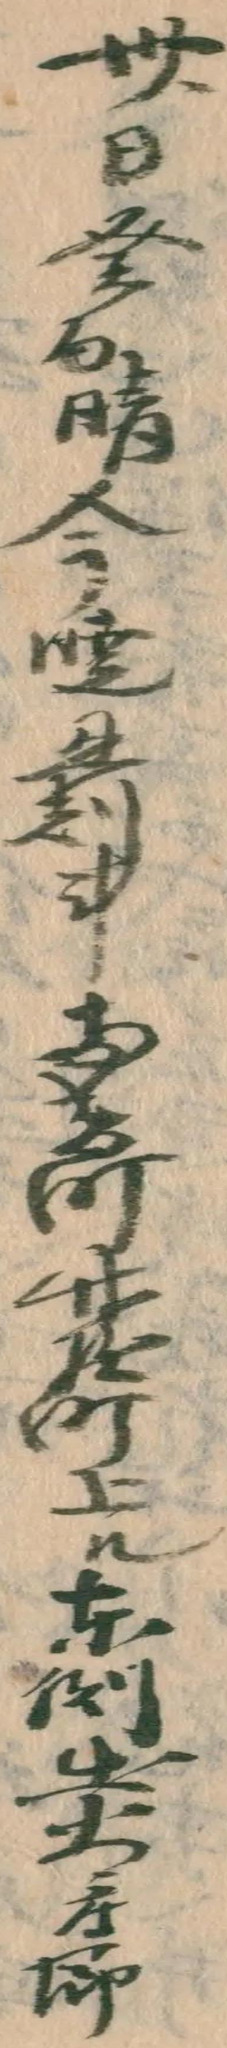卅日癸酉晴今暁丑刻斗両替町竹屋町上ル東側出火ニ付即
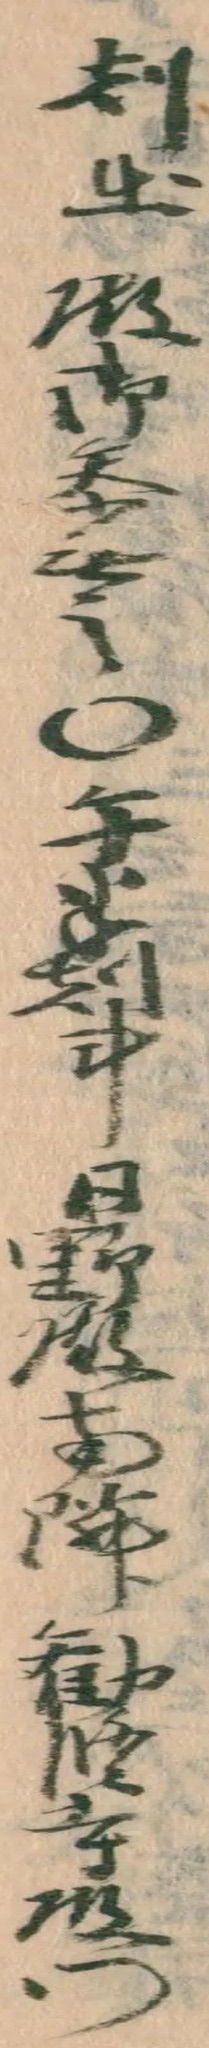刻出殿御恙無也〇午半刻斗日野殿南隣勧修寺殿門
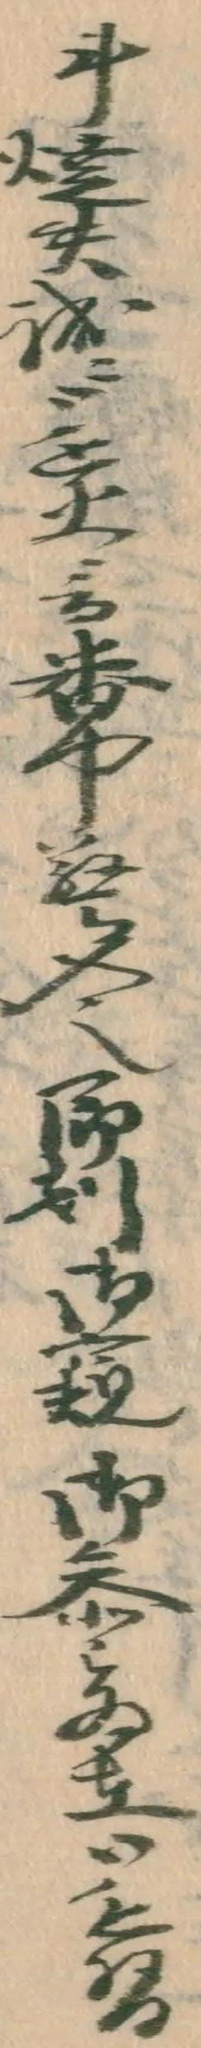斗焼失誠ニ御近火ニ而番中驚入也即刻御窺御参被為在御近習
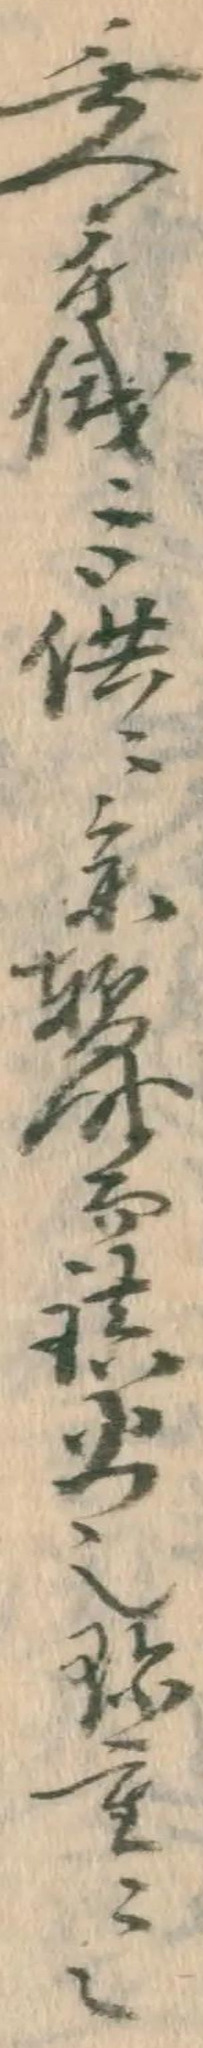無人ニ付俄ニ御供二参暫時而鎮火之珍重々々
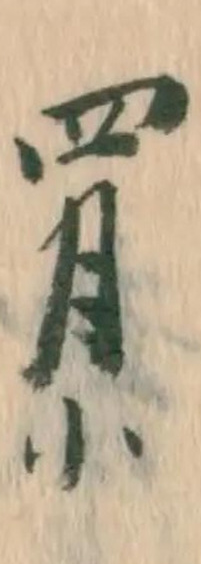四月小
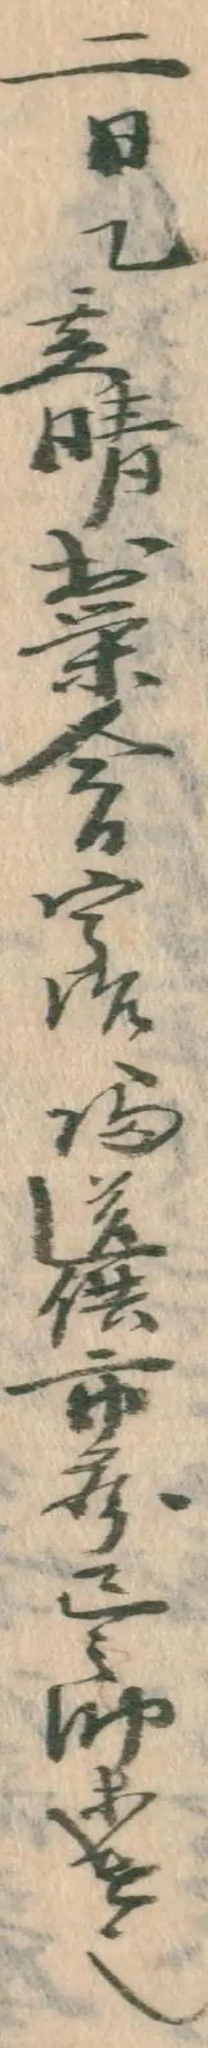二日乙亥晴お栄今日宇治へ帰道供市蔵巳之助等遣也
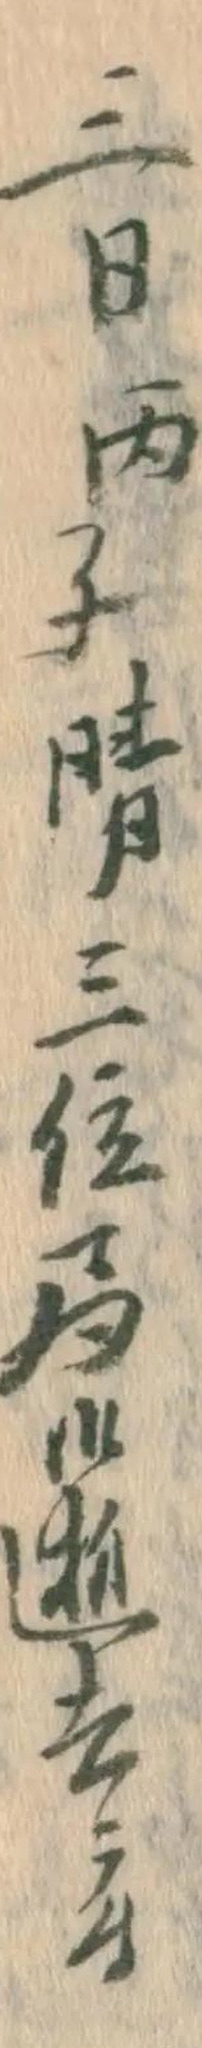三日丙子晴三位局御逝去に付
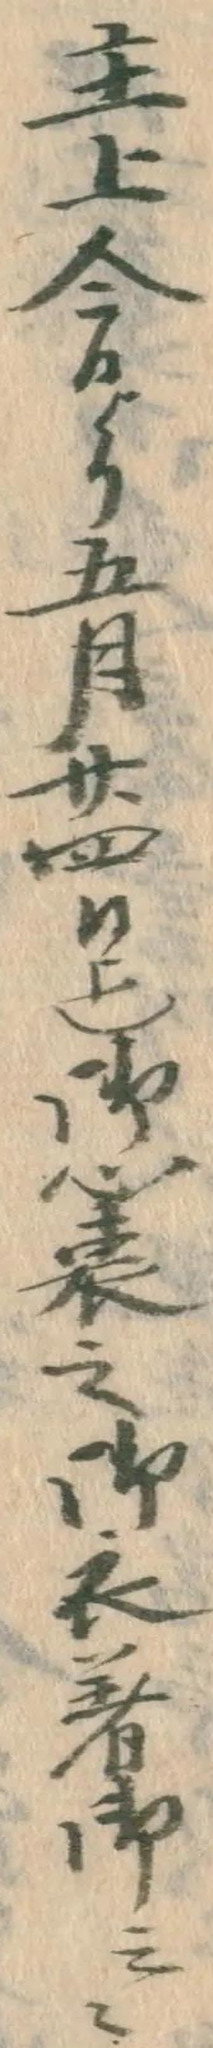主上今日より五月廿四日迄御心喪之御衣着御云々
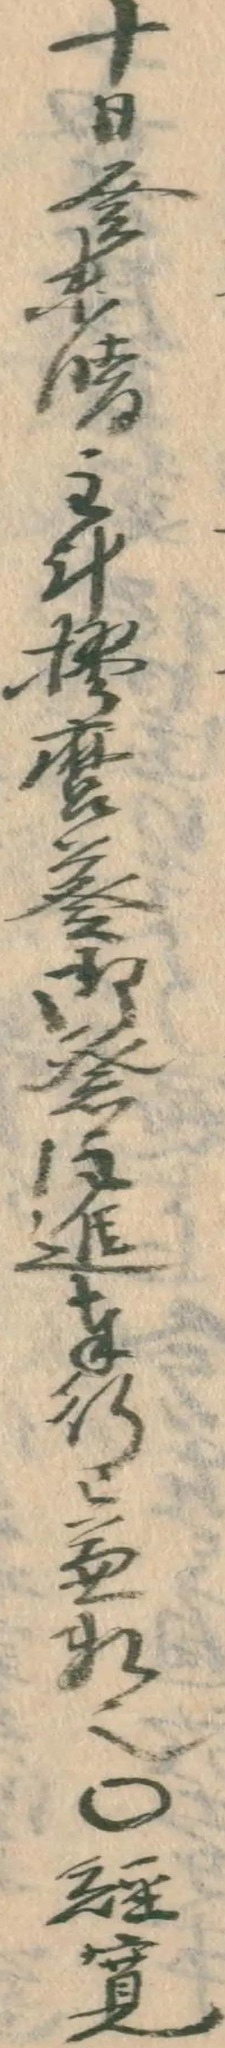十日癸未晴主斗播磨葵御祭注進奉行被兼頼也○経寛
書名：賀茂社記録. 第69冊
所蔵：国立国会図書館 National Diet Library, JAPAN
